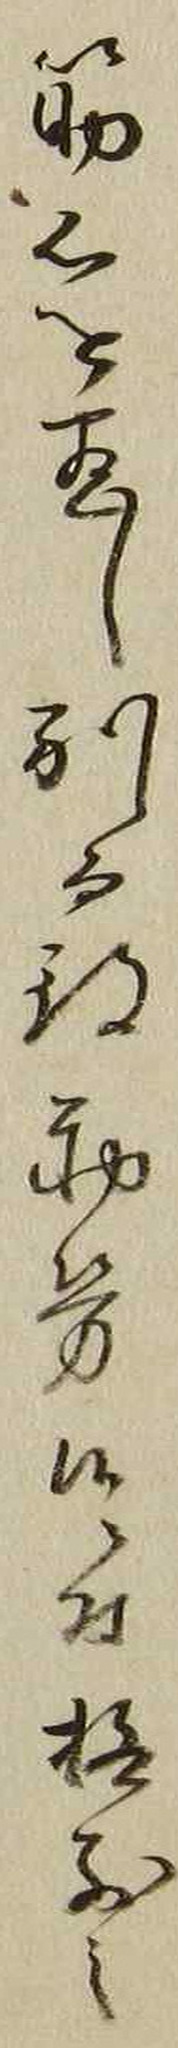筋心を尽し別而致勤労候ニ付格別之
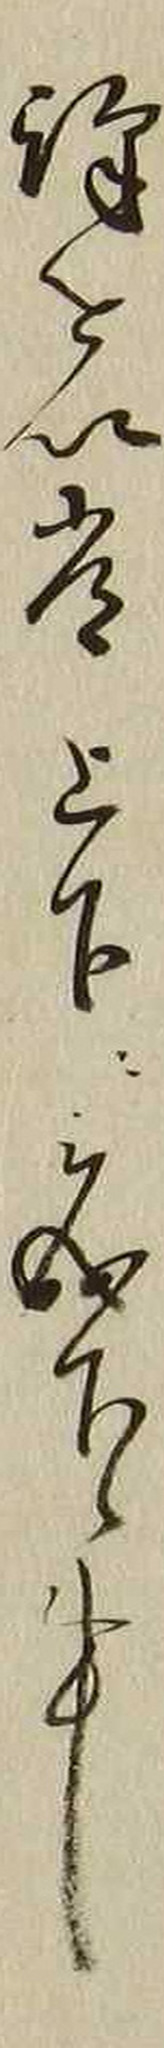訳を以常上下ニ被成下候事
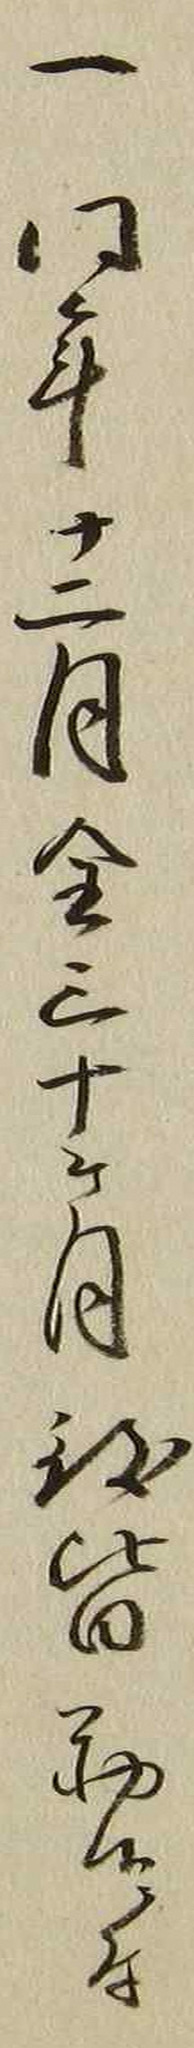一同年十二月全三十ケ月致皆勤候ニ付
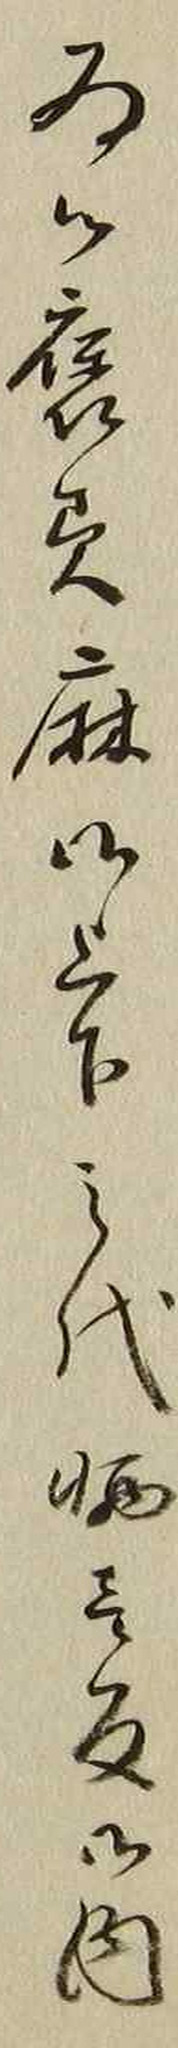為御褒美麻御上下之代晒壱反御内
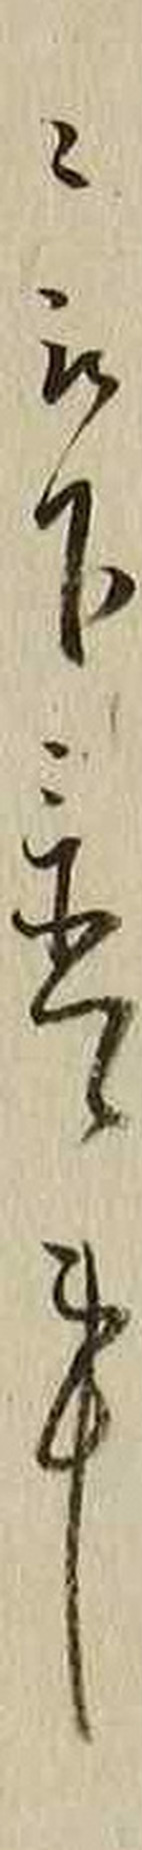々被下置候事
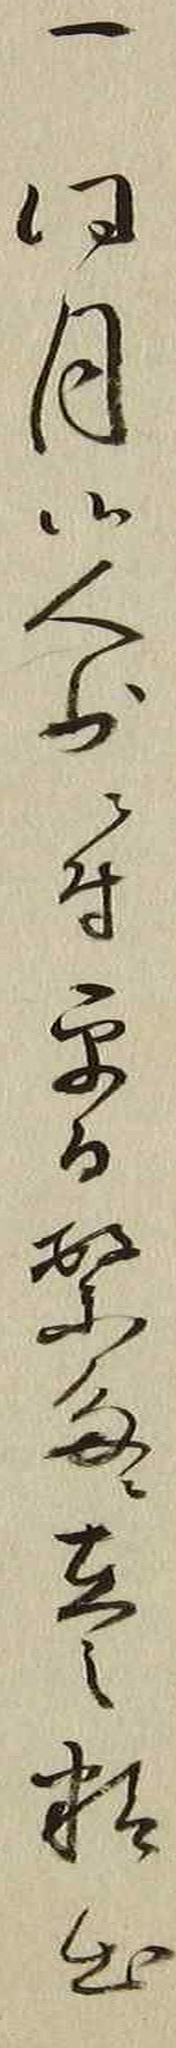一同月御人少ニ付平日繁多ニ在之精出
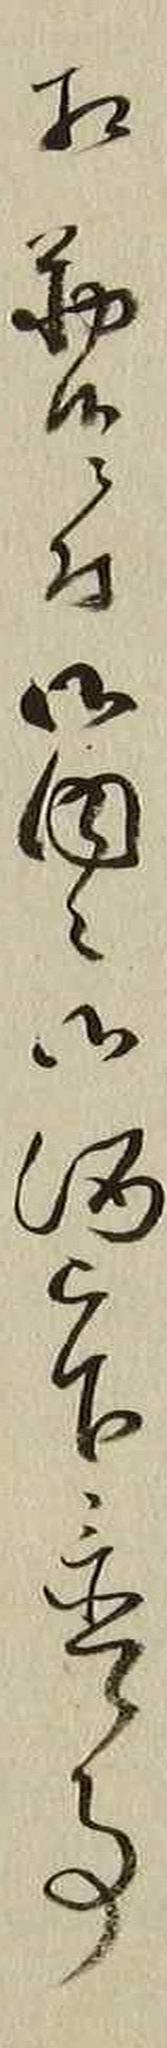相勤候ニ付御内々御酒被下置候事
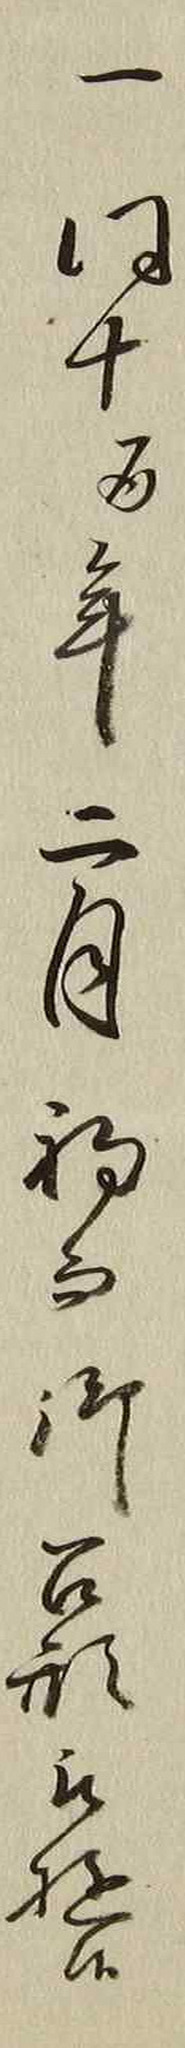一同十酉年二月初而御召形被遊候
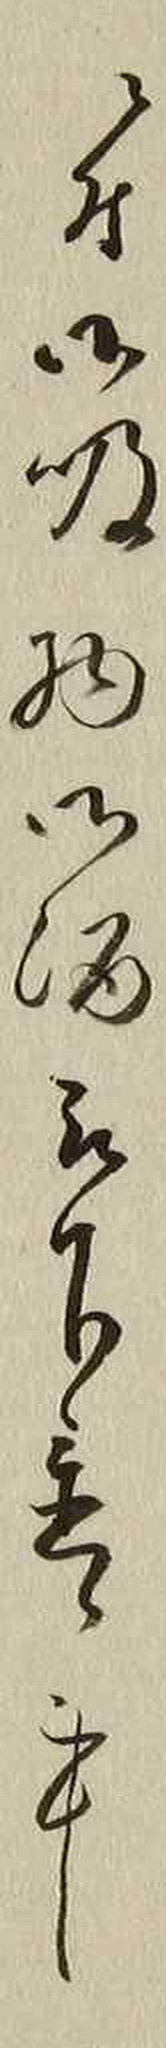ニ付御吸物御酒被下置候事
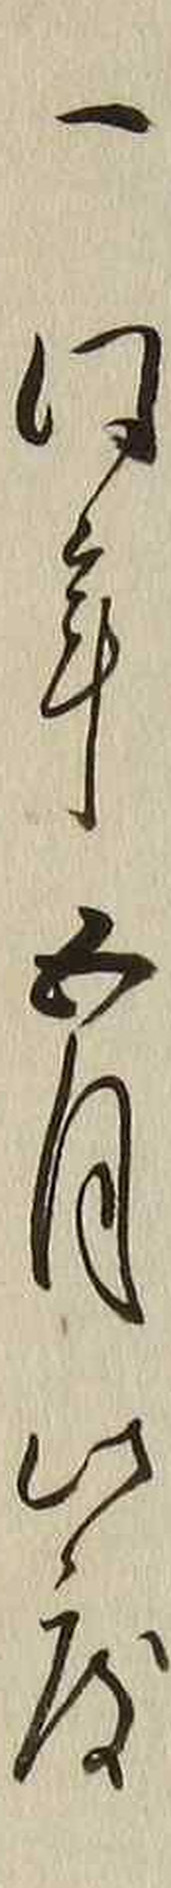一同年五月此度
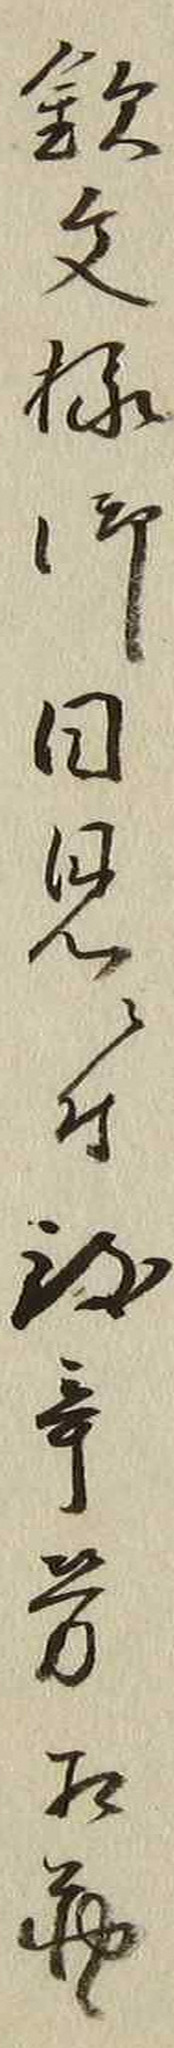欽文様御目見ニ付致辛労相勤候
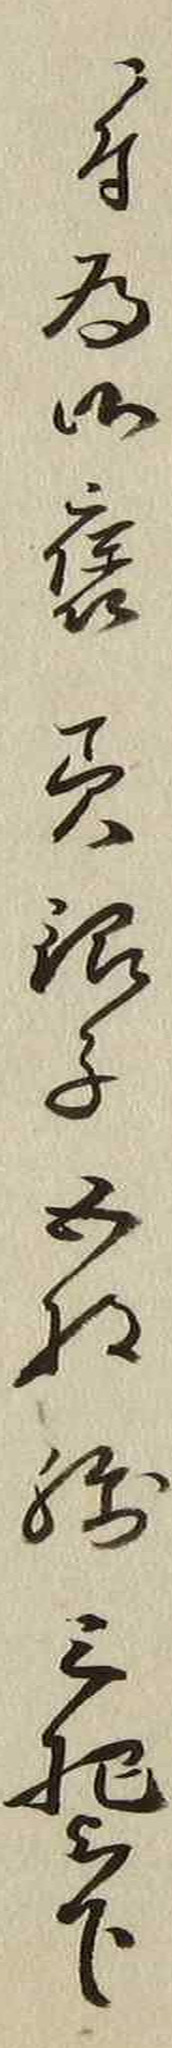ニ付為御褒美銀子五枚綿三把被下
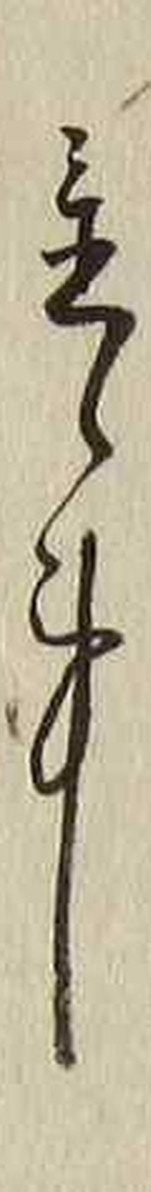置候事
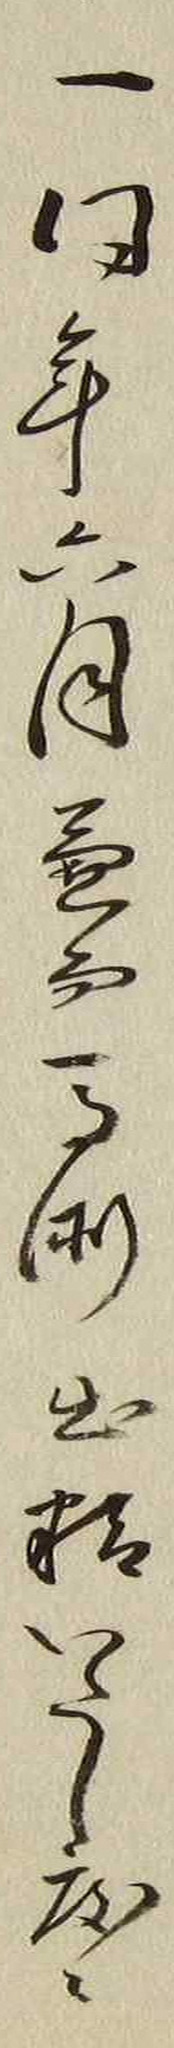一同年六月兼而馬術出精いたし度々
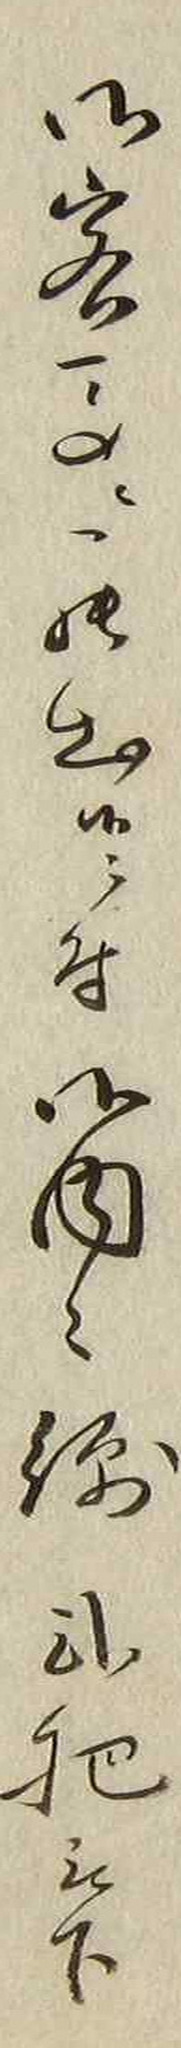御客馬ニ罷出候ニ付御内々綿弐把被下
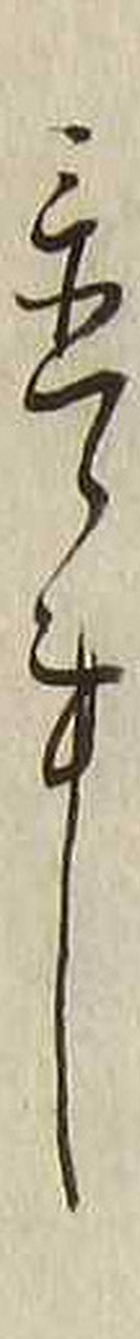置候事
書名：諸士系譜　巻之25　い之部25
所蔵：会津若松市立会津図書館
